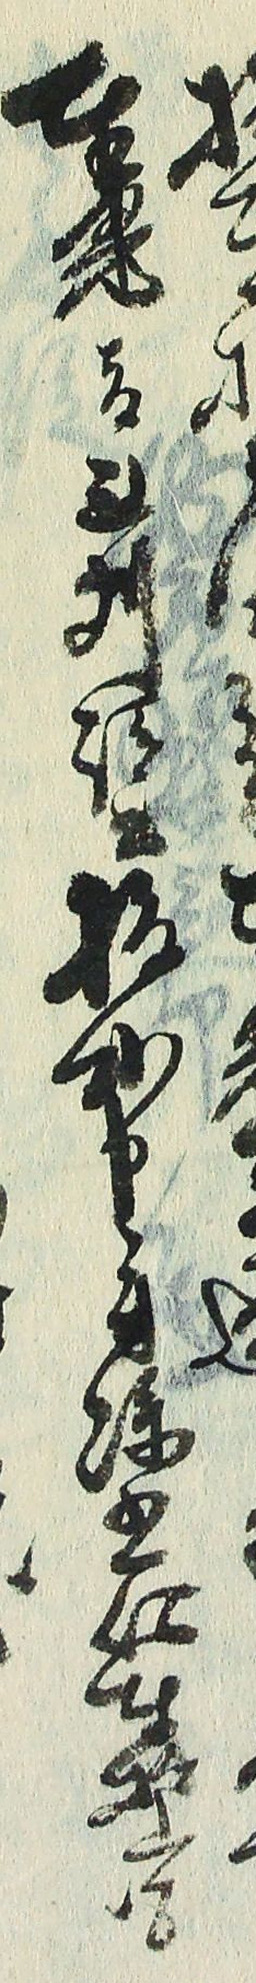奉畏旨連判請書指出申に付添書仕奉指上候以上
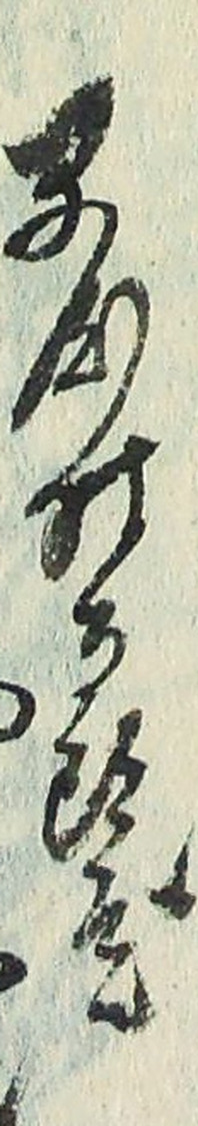早渕村与頭庄屋
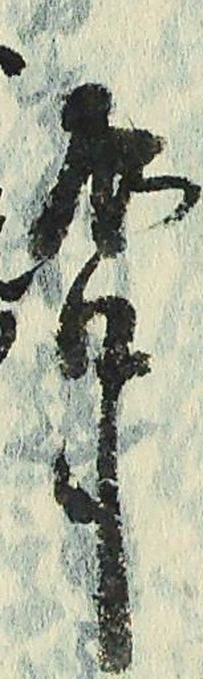辰四月
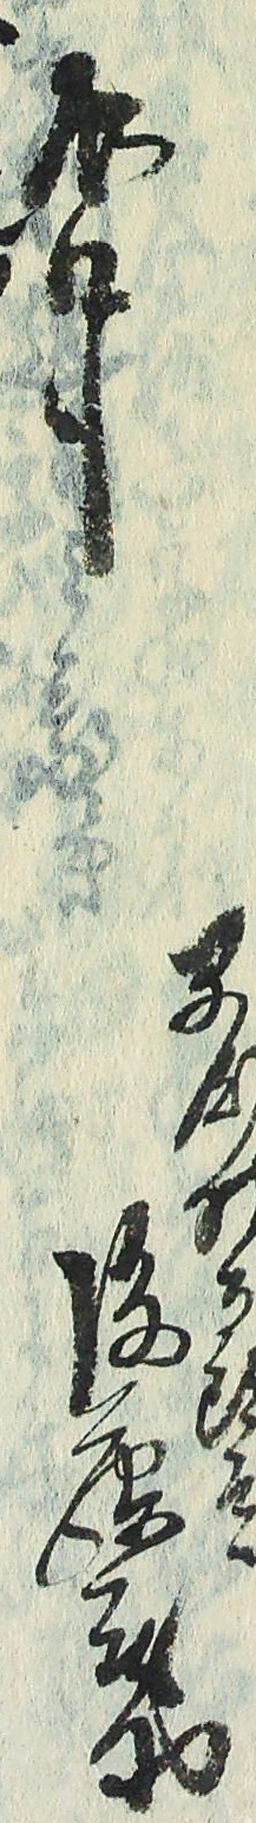後藤庄助
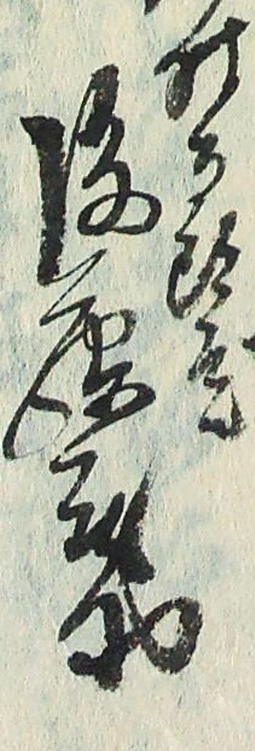後藤庄助
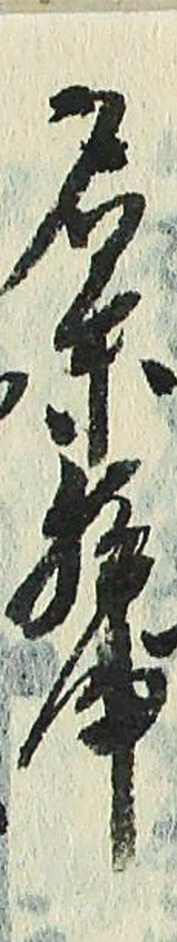名東勝浦
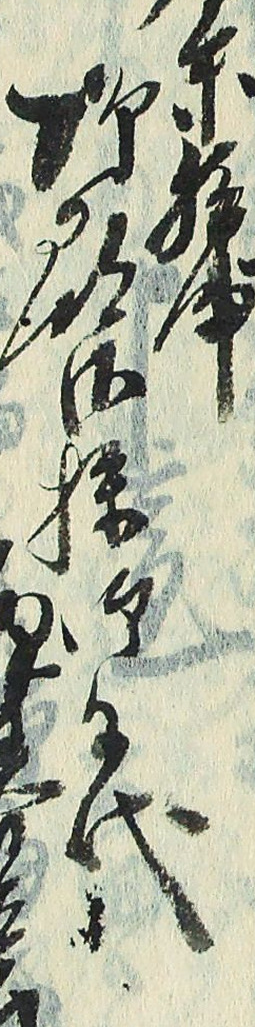御郡代様御手代
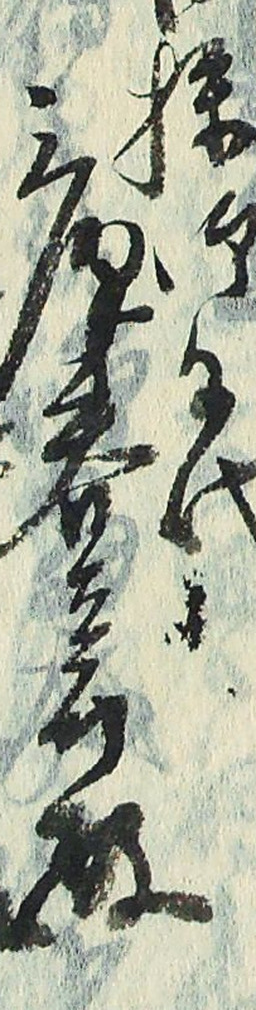三沢春太郎殿
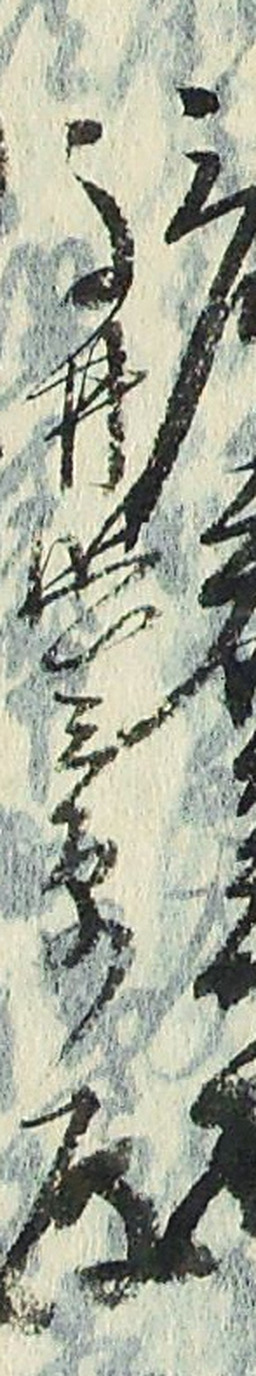高井与三兵衛殿
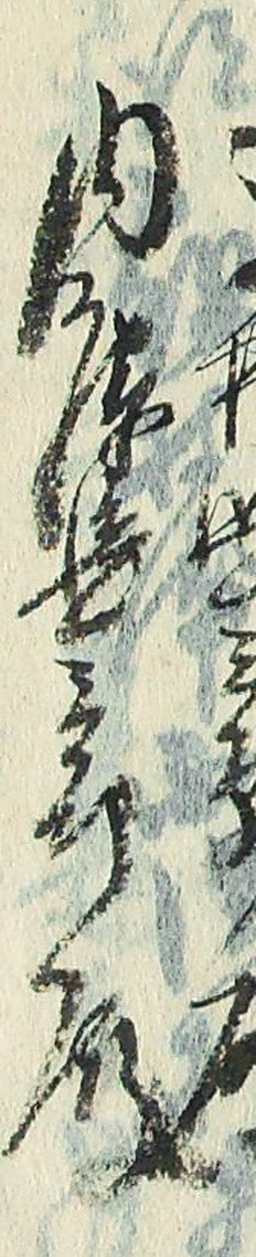内藤長三郎殿

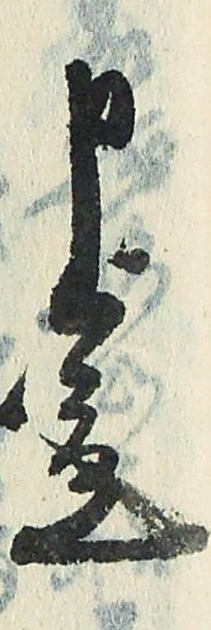申上覚
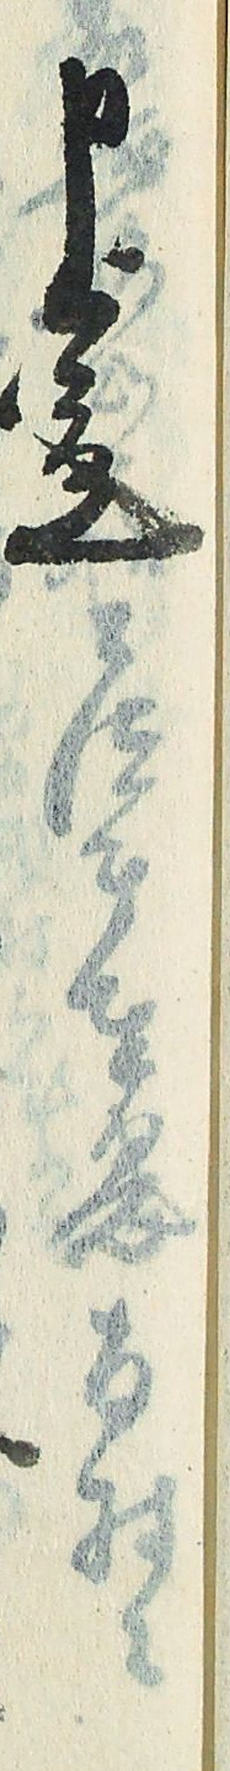申上覚
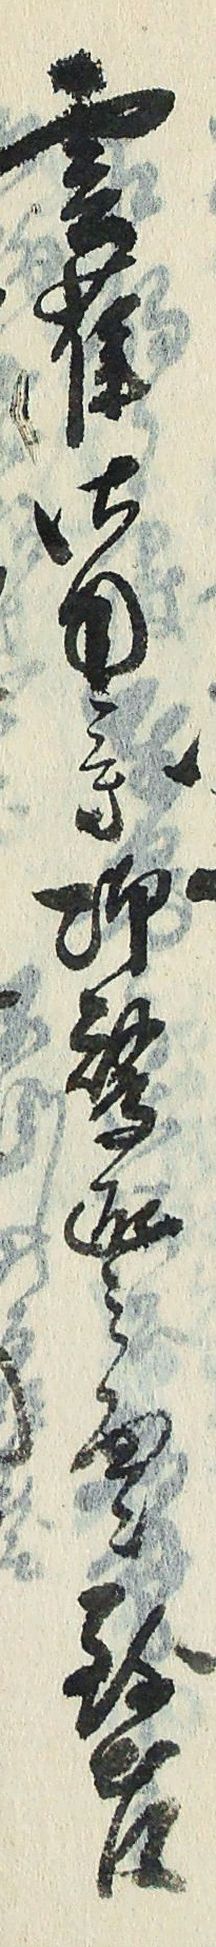雲雀御用に付御鷹匠之面々致出郷
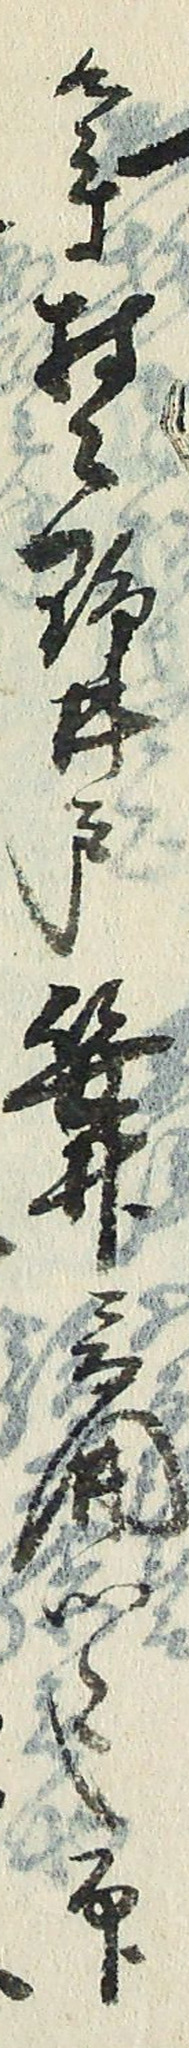候に付村々野井戸笹竹に而囲いたし印
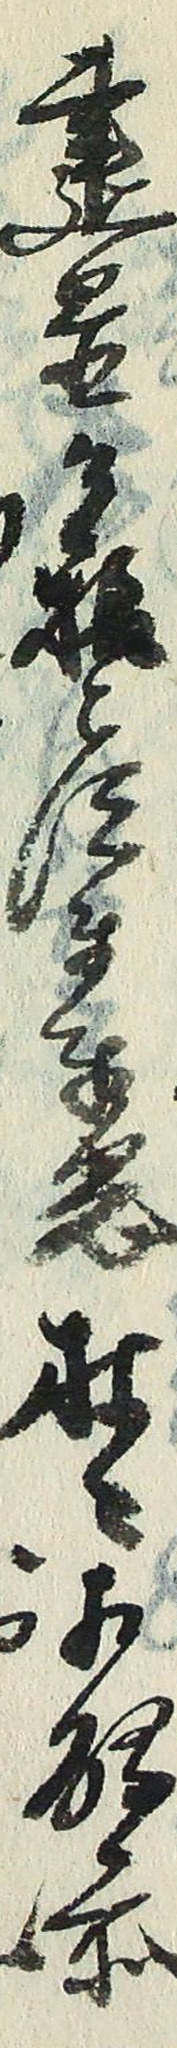建置候様被仰付奉畏村々相触候所
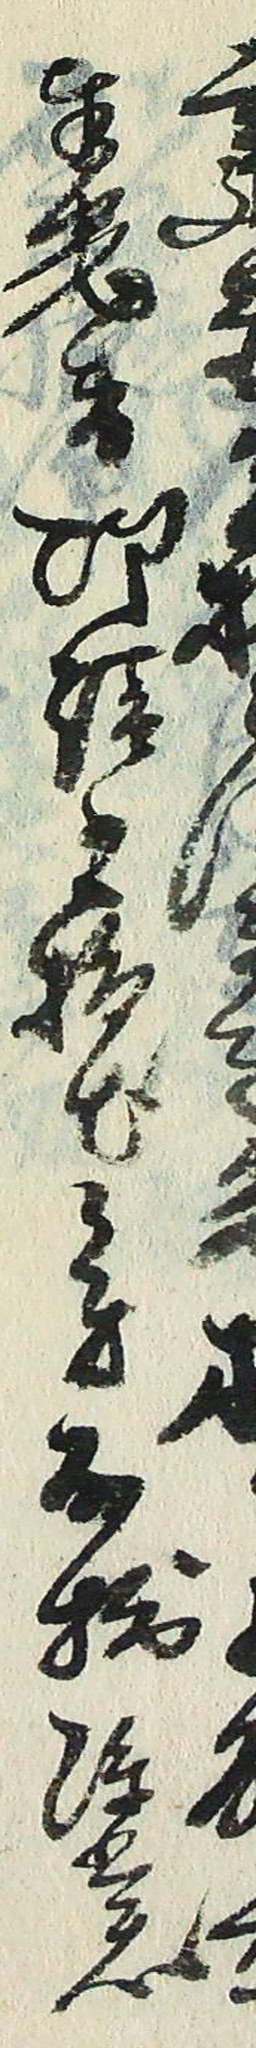奉畏旨御請書指出候に付取揃添書を以
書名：諸御用御□受書控
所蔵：鳴門教育大学 Naruto University of Education
